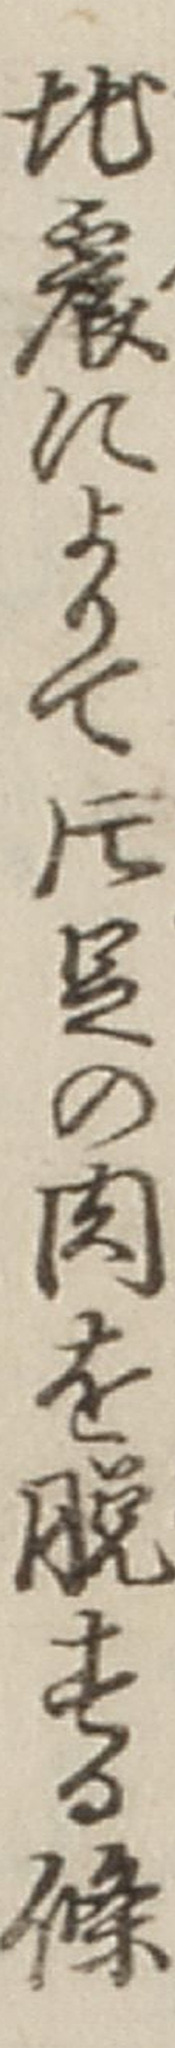地震によりて片足の肉を脱する条
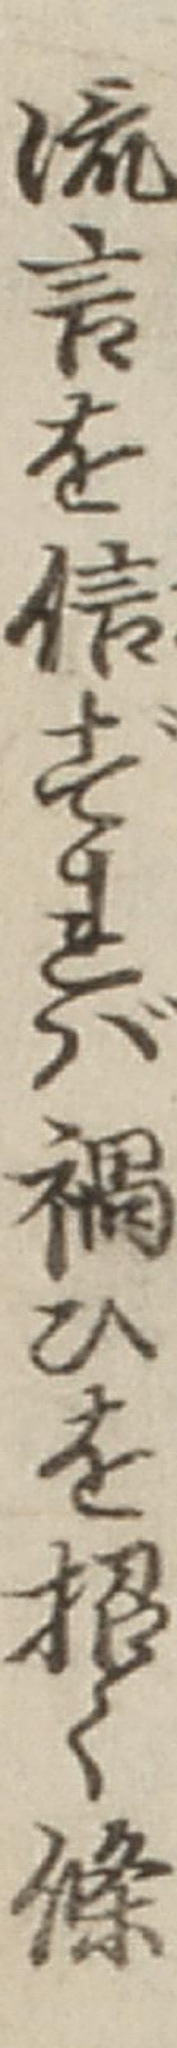流言を信ずれば禍ひを招く条
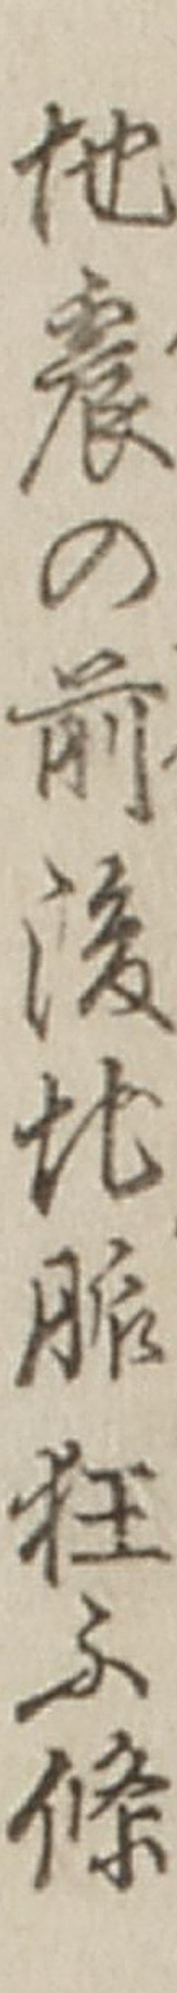地震の前後地脈狂ふ条
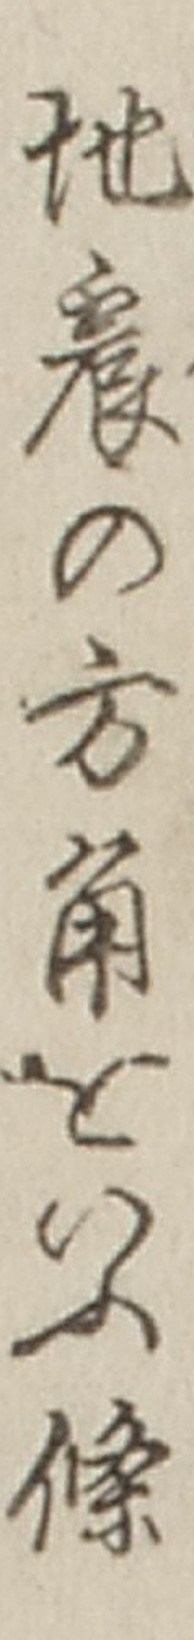地震の方角をいふ条
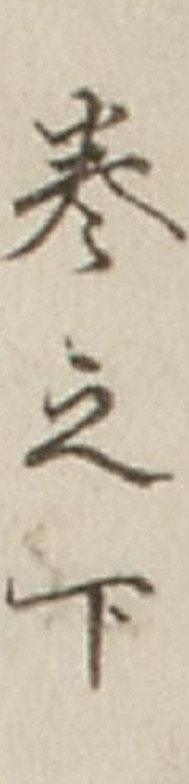巻之下
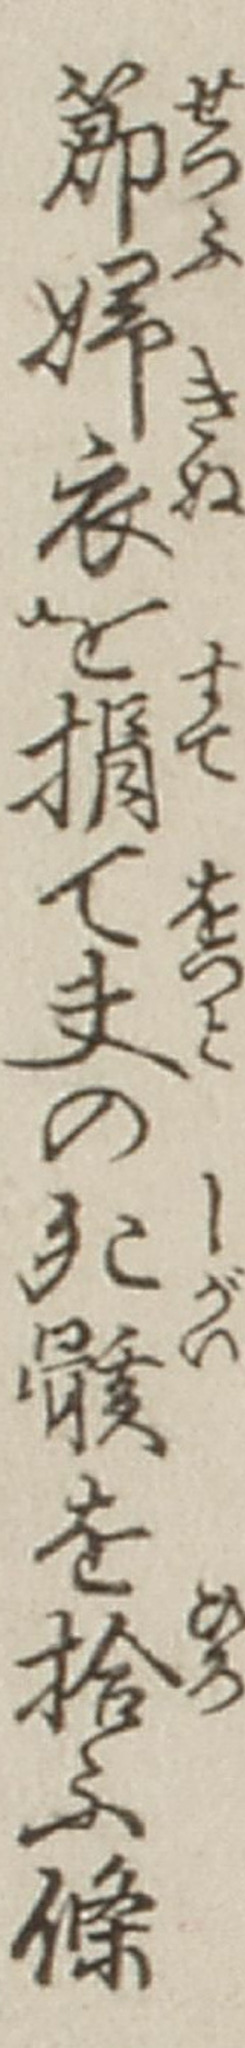節婦衣を捐て夫の死骸を拾ふ条
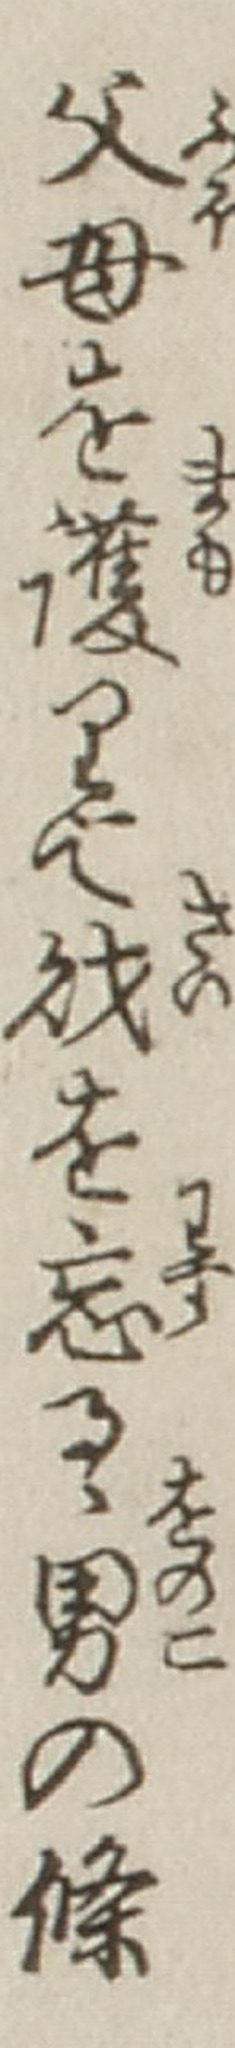父母を護りて財を忘るゝ男の条
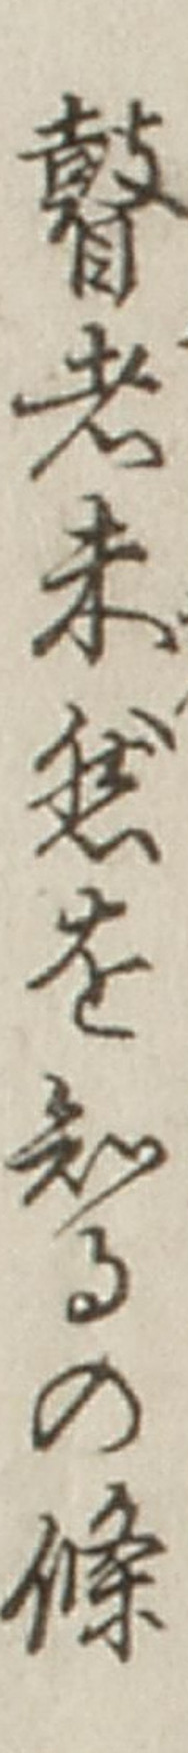瞽者未然を知るの条
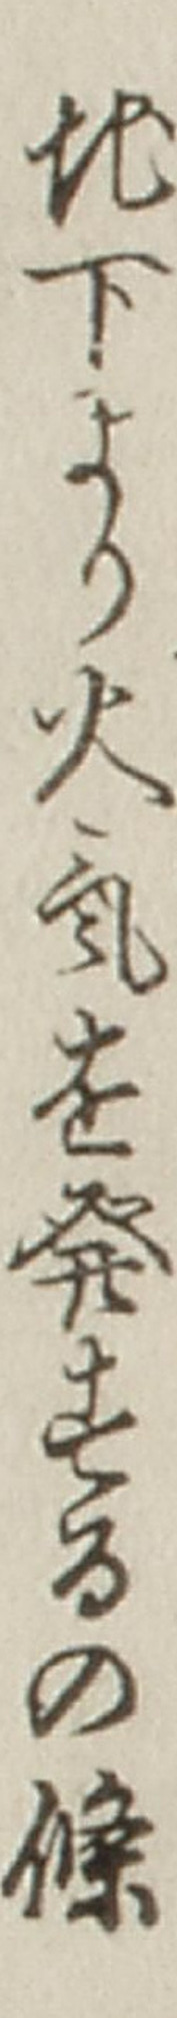地下より火気を発するの条
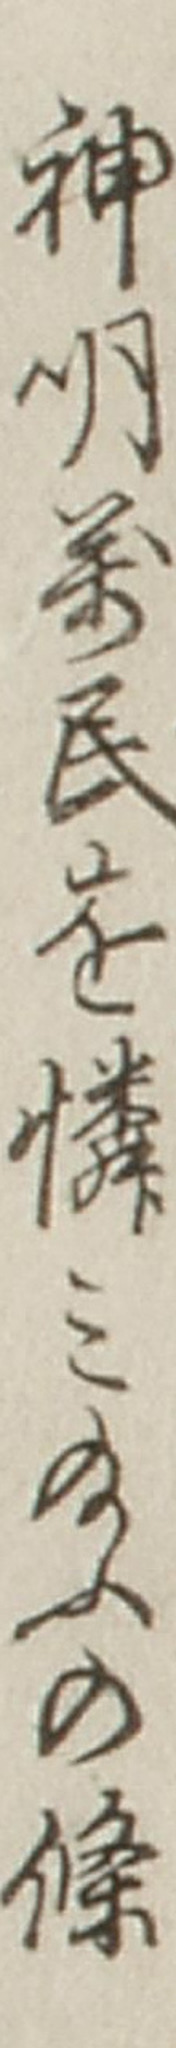神明万民を憐み給ふの条
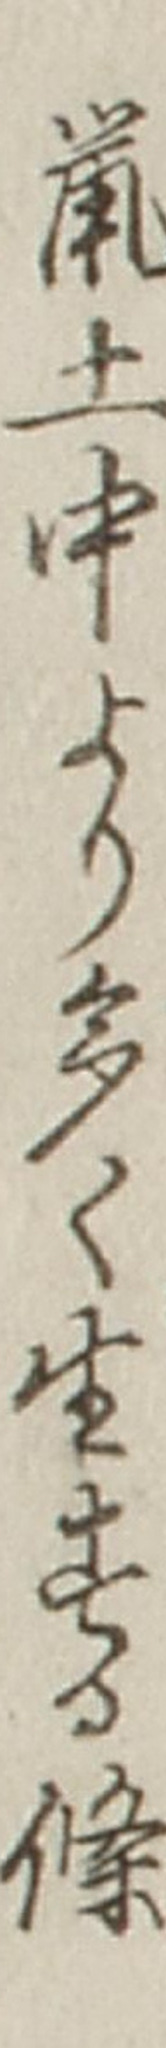鼠土中より多く生する条
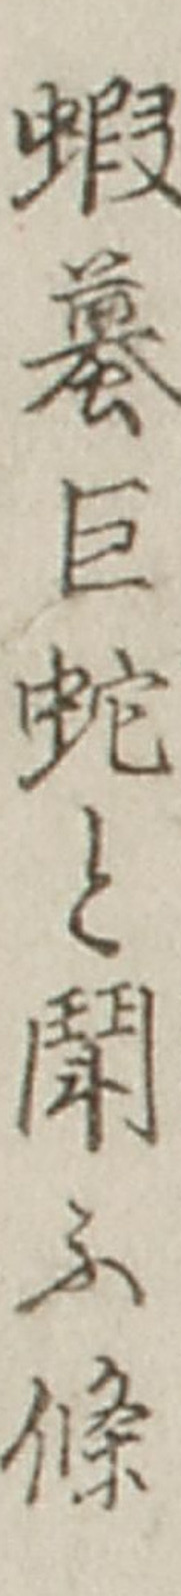蝦蟇巨蛇と闘ふ条
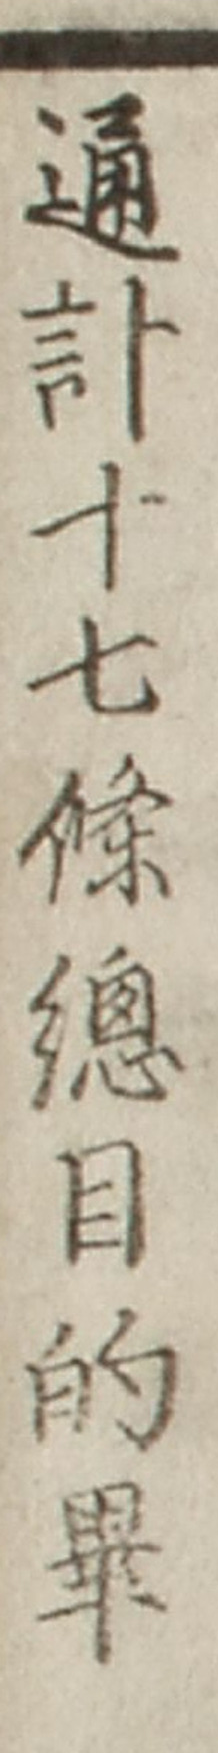通計十七条総目的畢

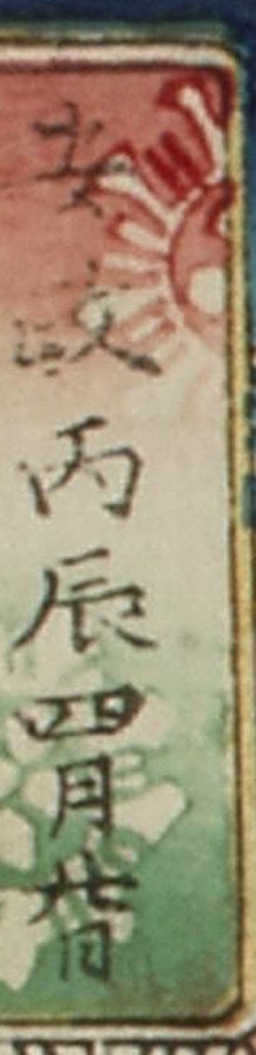安政丙辰四月廿日
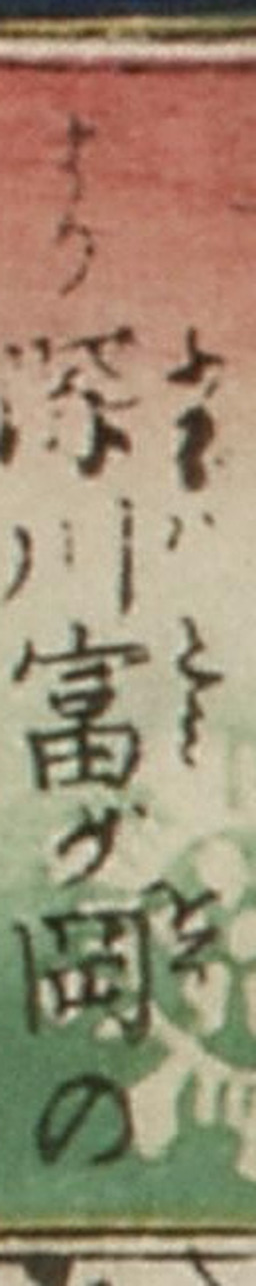より深川富ヶ岡の
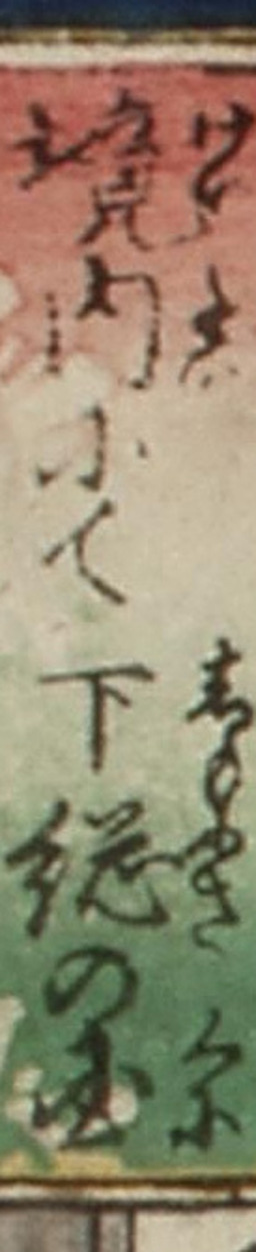境内にて下総の国
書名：安政見聞録　上
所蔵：東京大学地震研究所図書室 Earthquake Research Institute Library, The University of Tokyo, JAPAN
